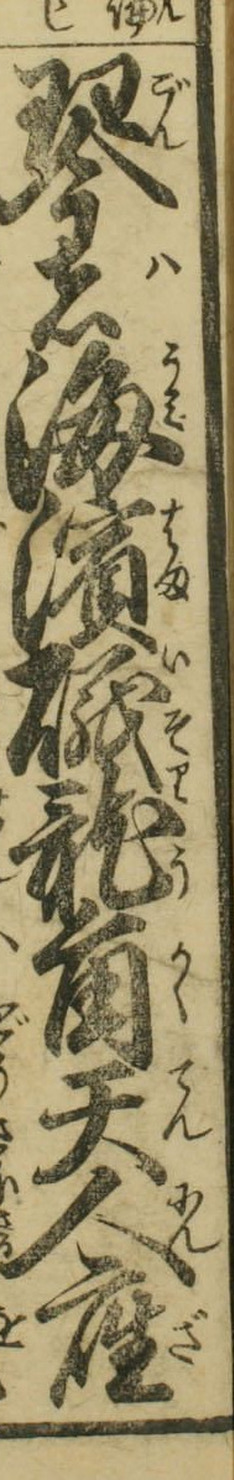琴者海濵磯龍角天人座
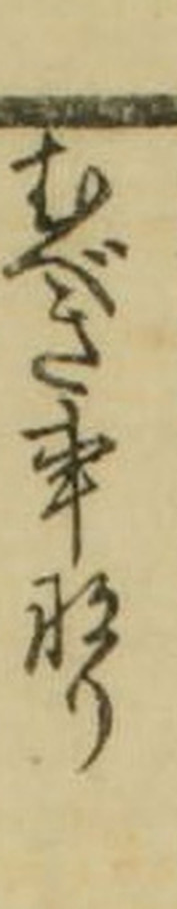むべき事なり
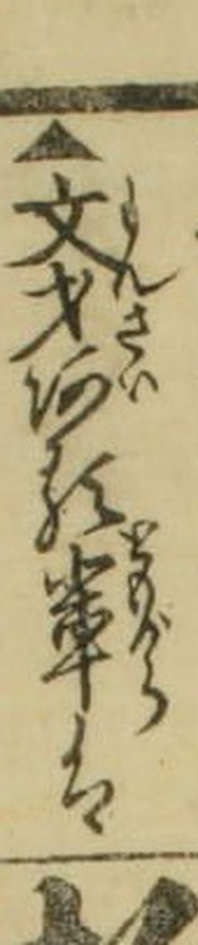▲文才ある輩は
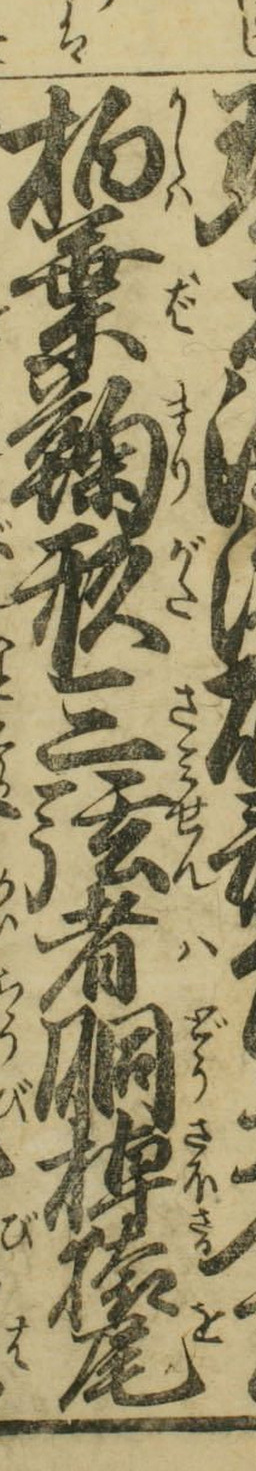柏葉鞠形三弦者胴棹猿尾
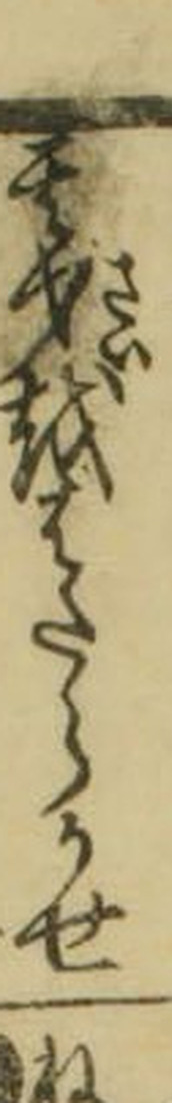其才をはたらかせ
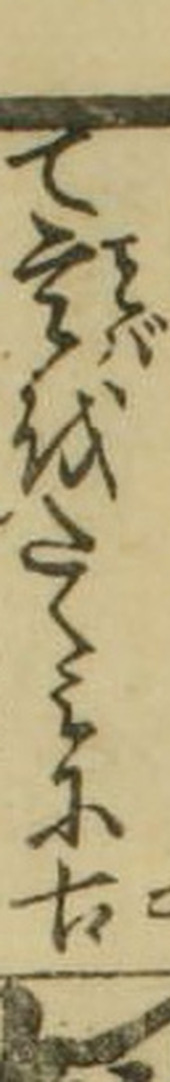て言をたくみに古
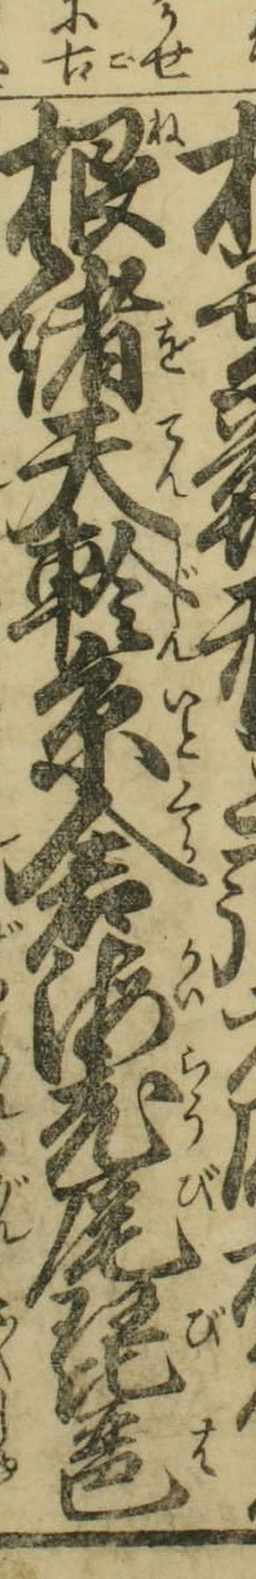根緒天軫糸倉海老尾琵琶
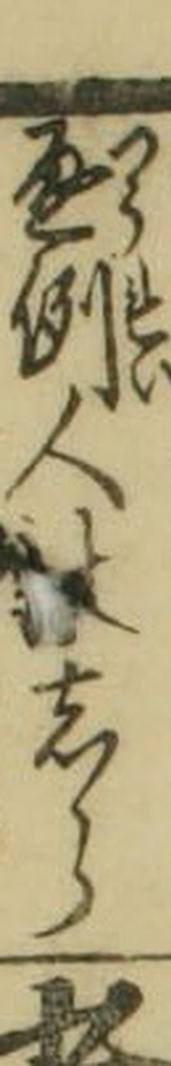通例人のしら
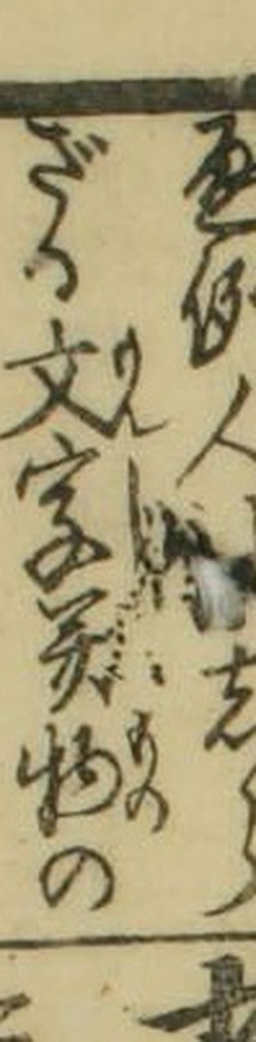ざる文字并物の
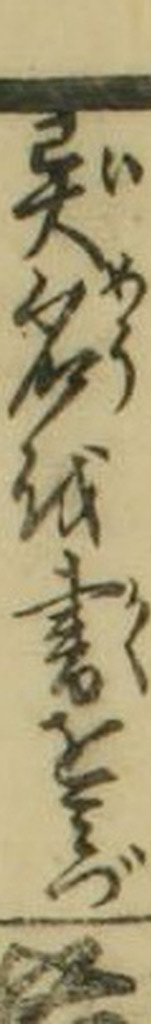異名を書をみづ
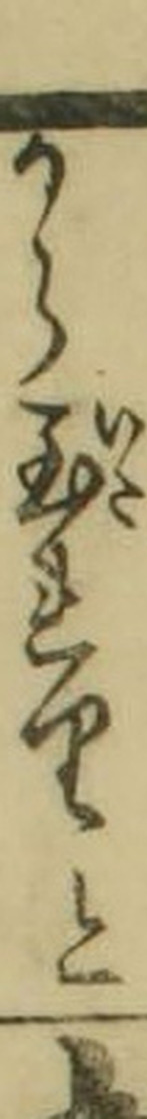から至れりと
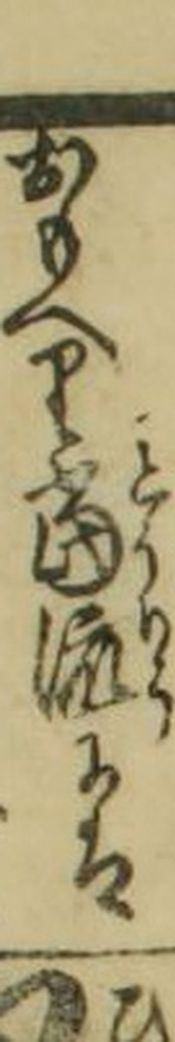おもへり当流には
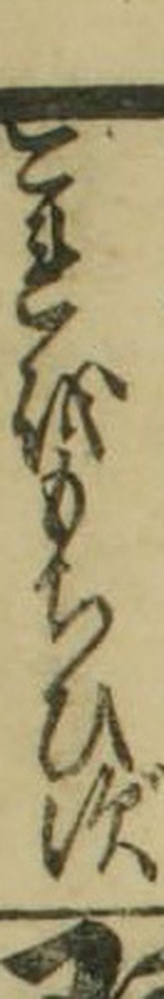これをもちひず

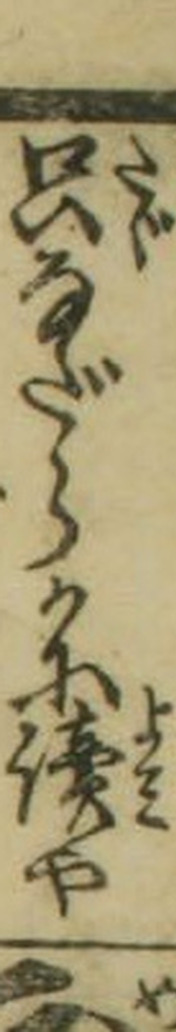只なだらかに読や
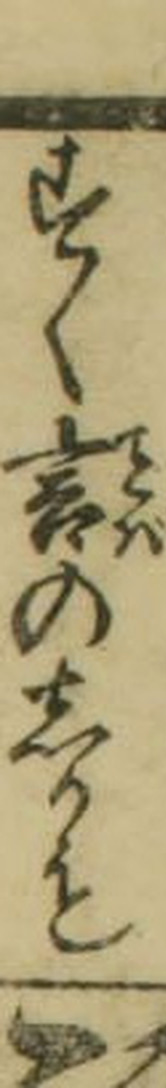すく言のしりも
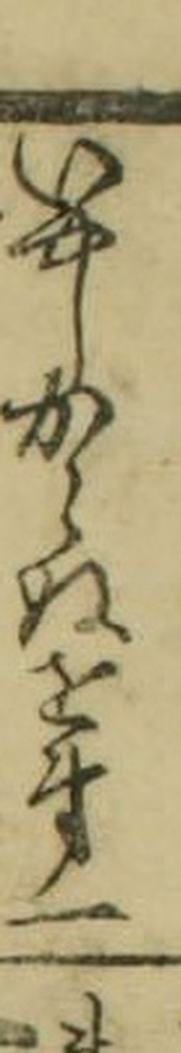いやしからぬを第一
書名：増補職人往来
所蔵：東京学芸大学教育コンテンツアーカイブ
